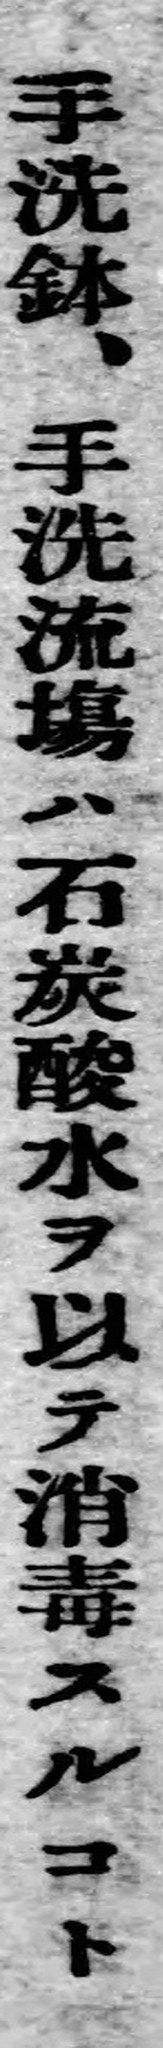手洗鉢、手洗流塲ハ石炭酸水ヲ以テ消毒スルコト
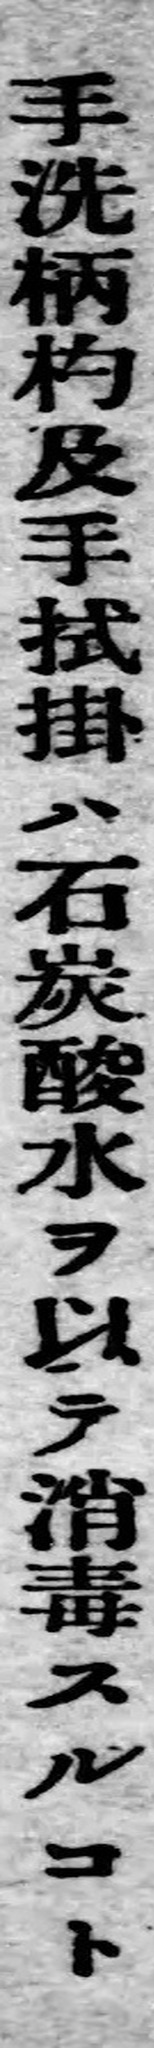手洗柄杓及手拭掛ハ石炭酸水ヲ以テ消毒スルコト
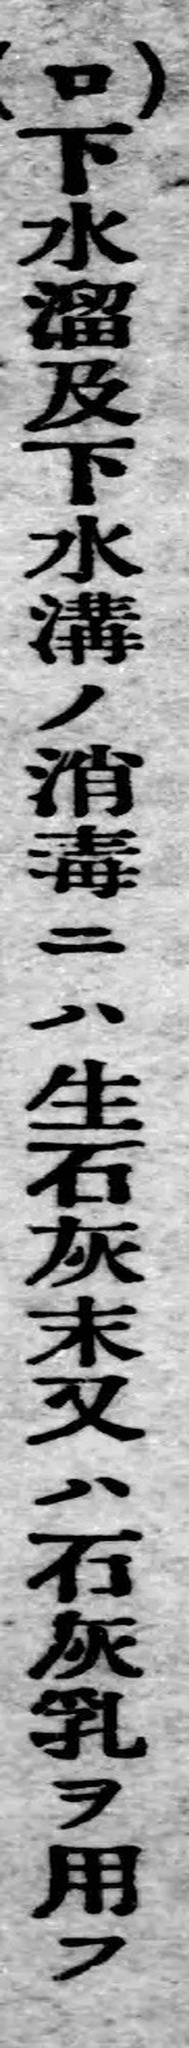(ロ)下水溜及下水溝ノ消毒ニハ生石灰末又ハ石灰乳ヲ用フ
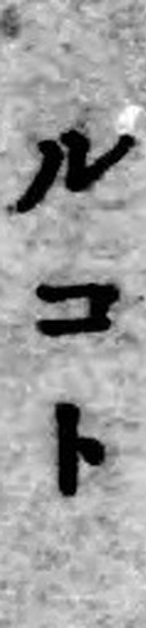ルコト
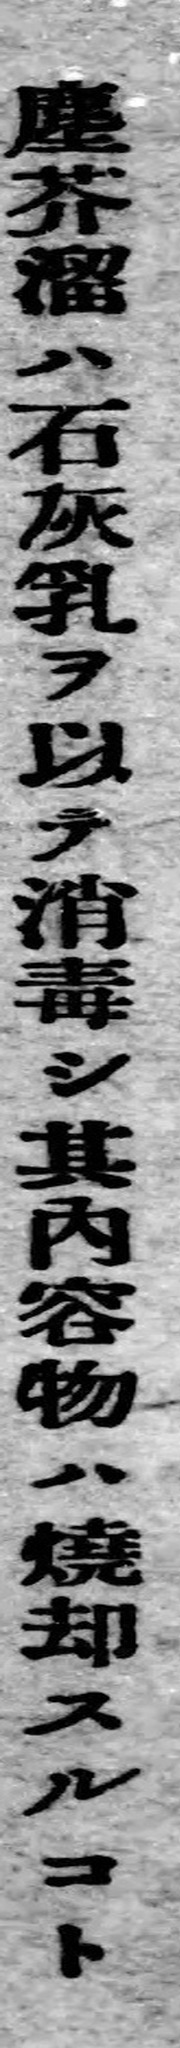塵芥溜ハ石灰乳ヲ以テ消毒シ其内容物ハ燒却スルコト

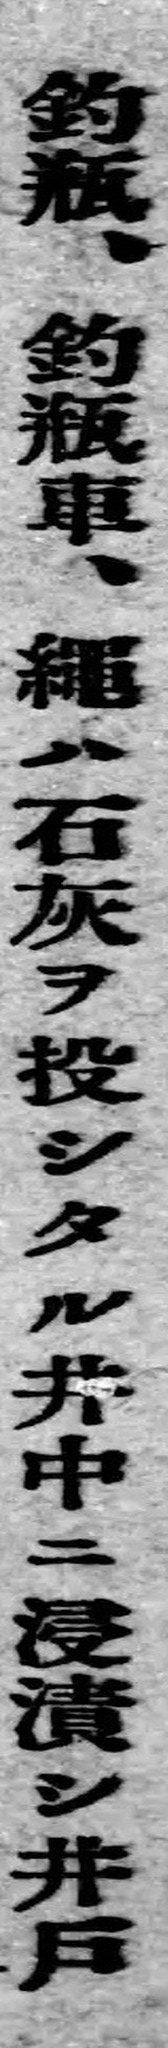釣瓶、釣瓶車、縄ハ石灰ヲ投シタル井中ニ浸漬シ井戸
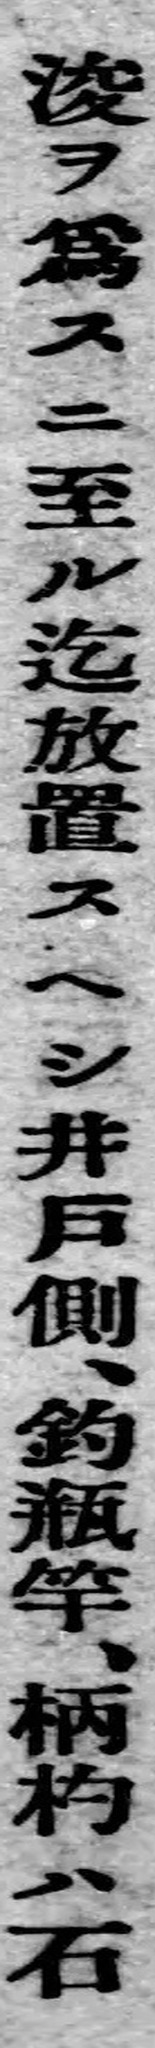浚ヲ爲スニ至ル迄放置スヘシ井戸側、釣瓶竿、柄杓ハ石
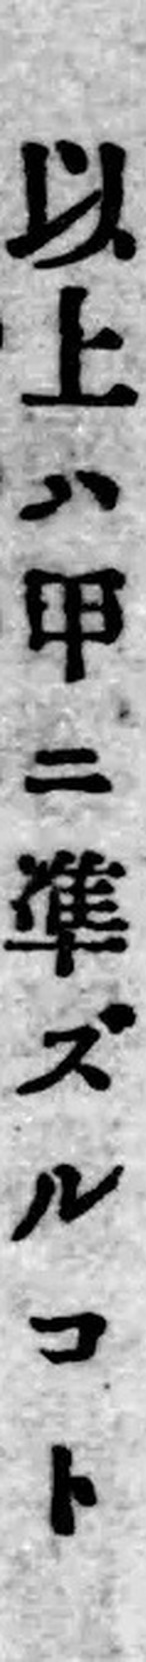以上ハ甲ニ準ズルコト
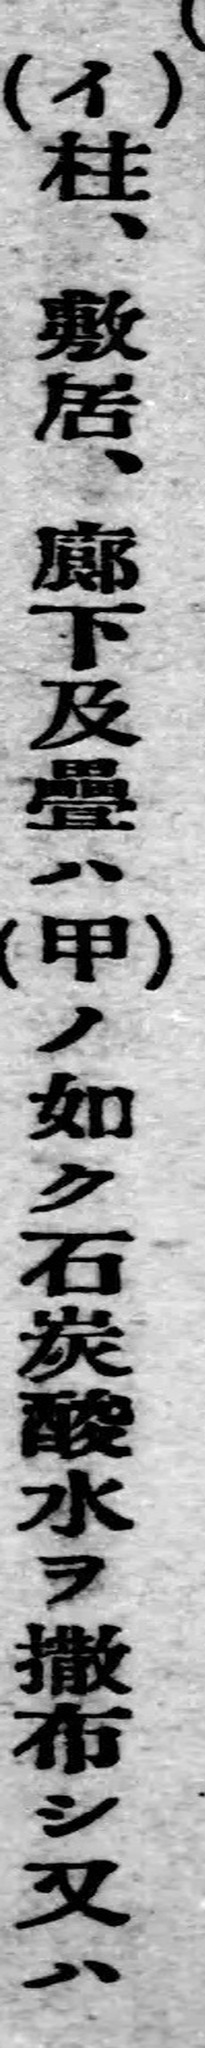(イ)柱、敷居、廊下及疊ハ(甲)ノ如ク石炭酸水ヲ撒布シ又ハ
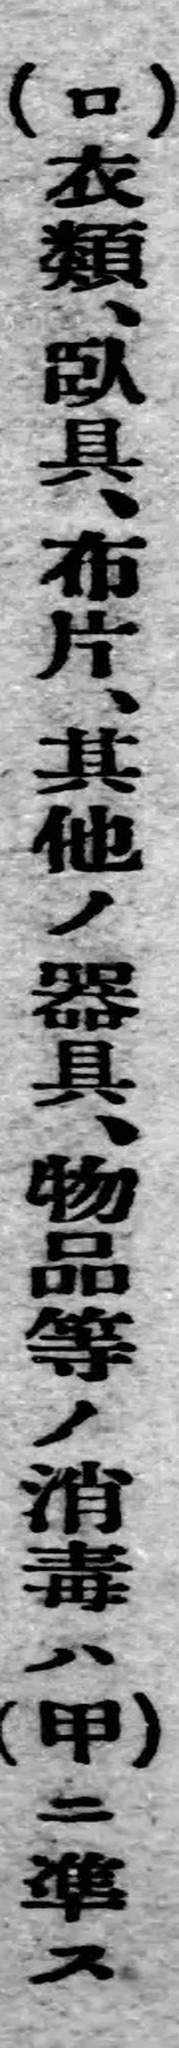(ロ)衣類、臥具、布片、其他ノ器具、物品等ノ消毒ハ(甲)ニ準ス
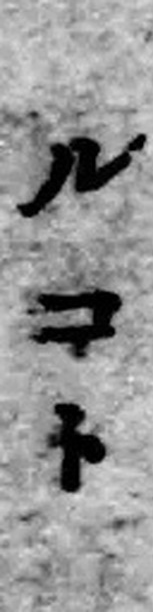ルコト
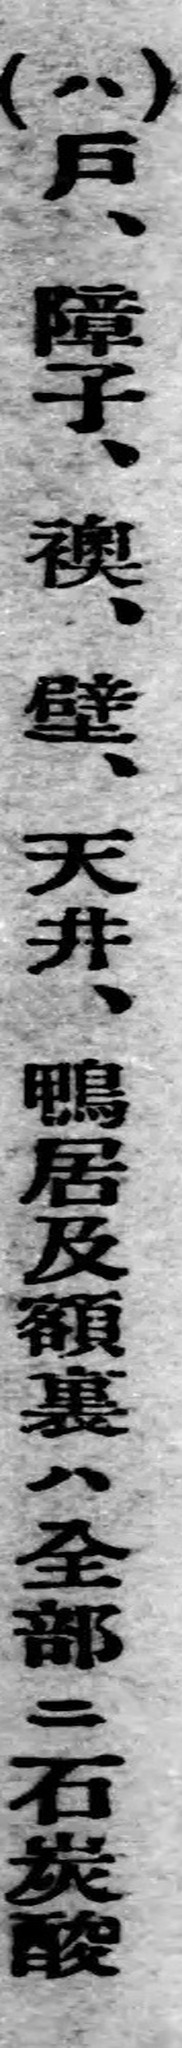(ハ)戸、障子、襖、壁、天井、鴨居及額裏ハ全部ニ石炭酸
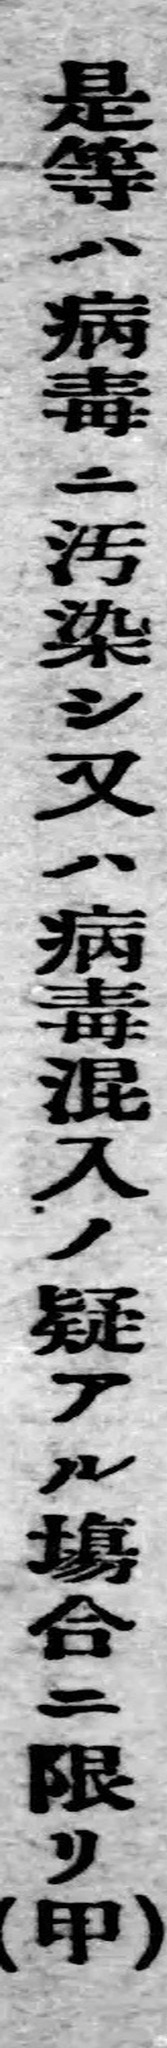是等ハ病毒ニ汚染シ又ハ病毒混入ノ疑アル塲合ニ限リ(甲)
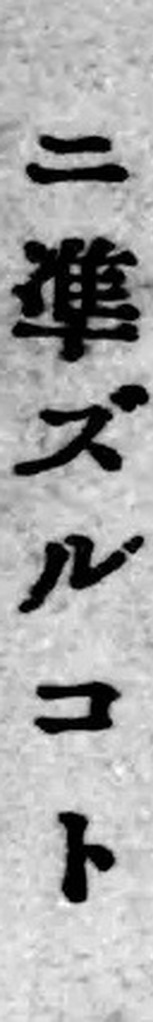ニ準ズルコト
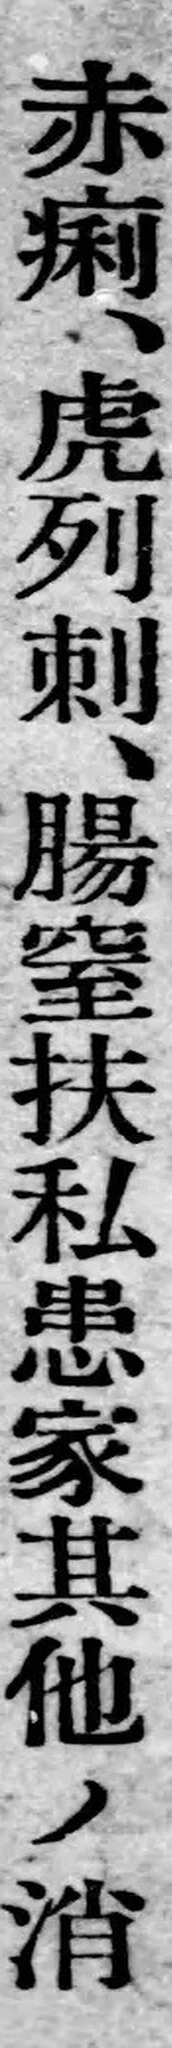赤痢、虎列刺、膓窒扶私患家其他ノ消
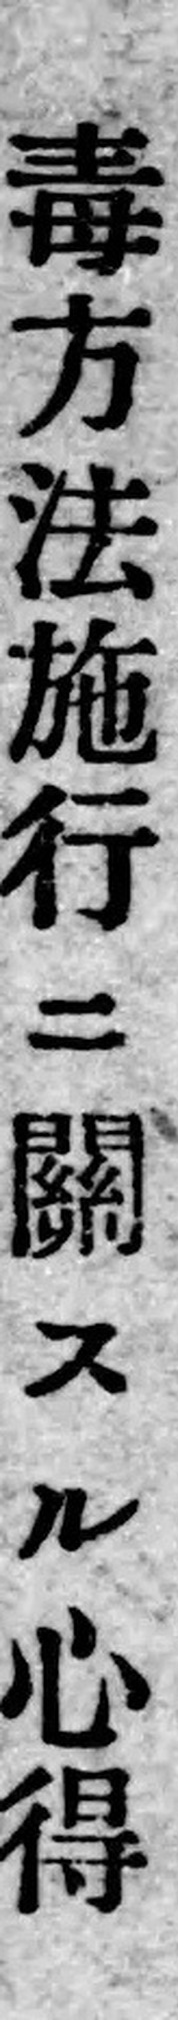毒方法施行ニ關スル心得
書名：袖珍防疫必携
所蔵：国立国会図書館 National Diet Library, JAPAN
